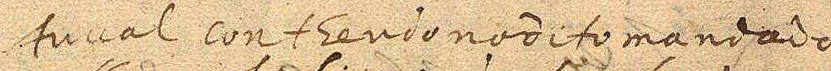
tuual contheudo no dito mandado
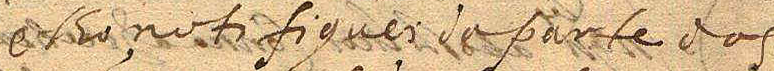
e lho notifiquei da parte dos
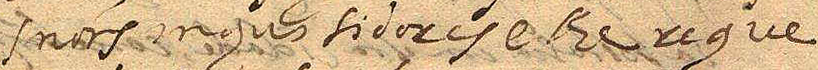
snor̄s inquisidores e lhe reque
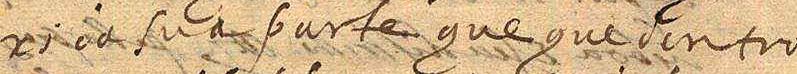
ri da sua parte que que dentro
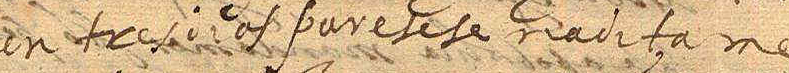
en tres dias paresese na dita me
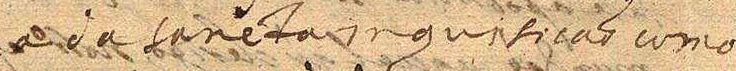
za da sancta inquisisaõ como
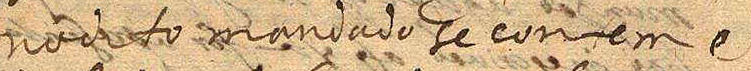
no dito mandado se contem e
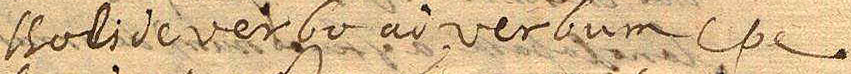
lho li de verbo ad verbum e pe
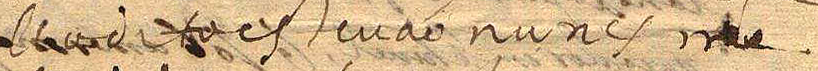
llo dito esteuaõ nunes me
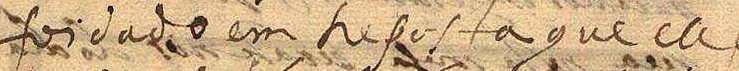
foi dado em Reposta que elle
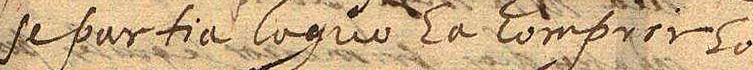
se partia loguo ha comprir ho
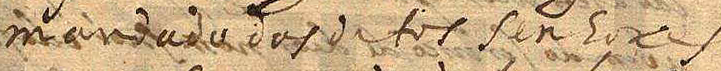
mandado dos ditos senhores
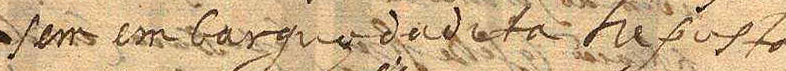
sem embarguo da dita Reposta
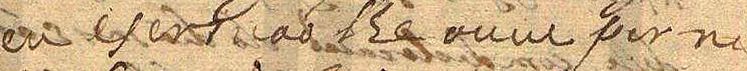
eu escriuaõ lhe ouue por no
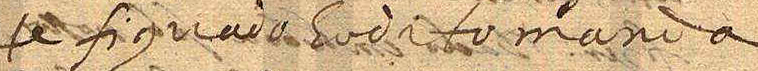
tefiquado ho dito manda
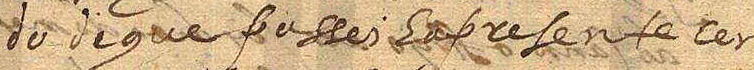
do de que passei ha presente cer
